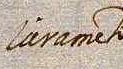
Iuramēto
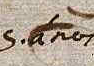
5. anos
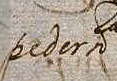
pedernra
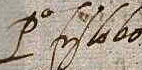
Po frz̄ lobo
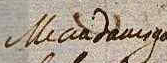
Mecia da ueiga
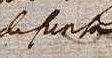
defunta
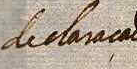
declaraçaõ
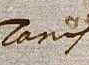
Tanis
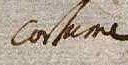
costume
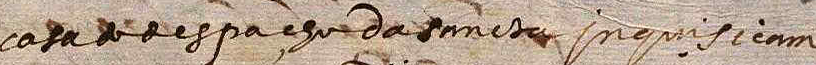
casa do despacho da sancta jnquisiçam
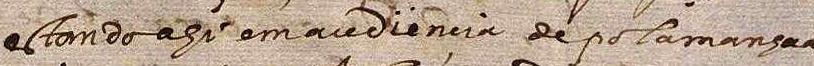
estando ahi em audiencia de pola manhaā
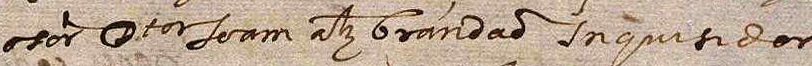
o sor̄ Dtor Joam al̄z brandaõ Inquisidor
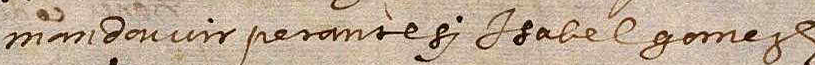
mandou uir perante sj Jsabel gomez
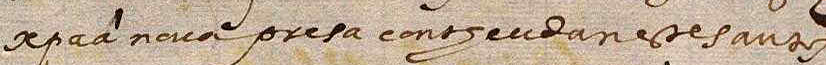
xpaā noua presa contheuda nestes autos
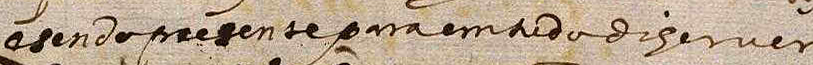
e sendo presente para em tudo dizer uer
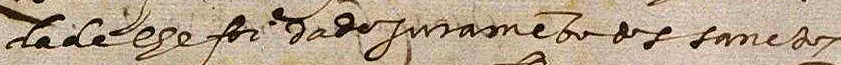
dade lhe foi dado Juramēto dos sanctos
